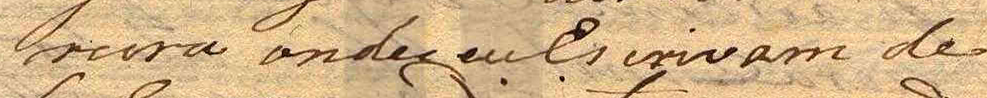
reira onde eu Escrivam de
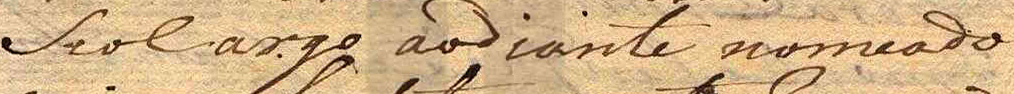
Seo Cargo aodiante nomeado
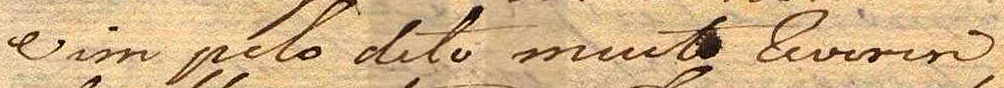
vim pelo dito muito Reveren
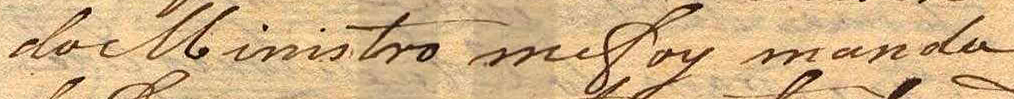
do Ministro me foy manda
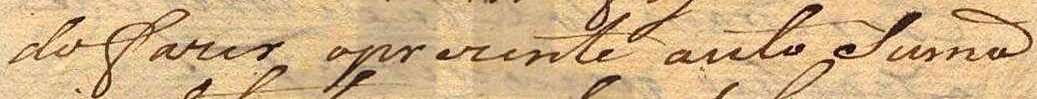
do fazer o prezente auto Suma
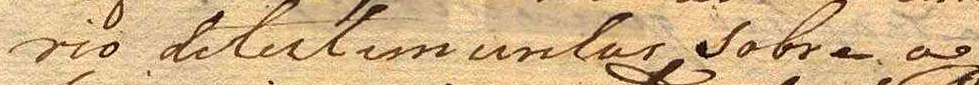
rio de testemunhas sobre a
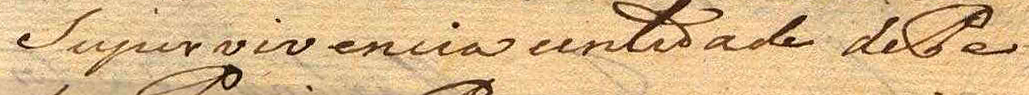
Supervivencia e entidade de Pe
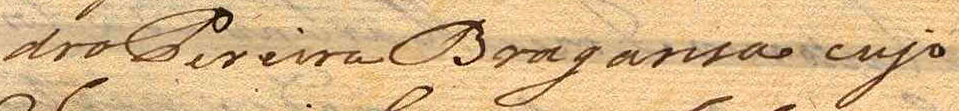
dro Pereira Bragansa cujo
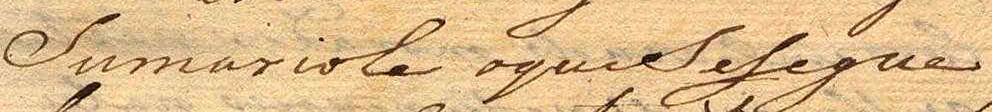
Sumario he o que Se segue
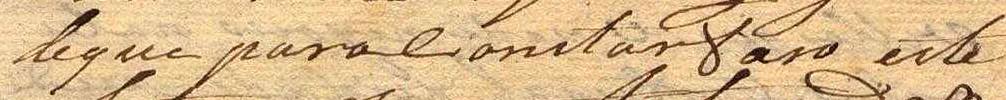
de que para Constar faso este
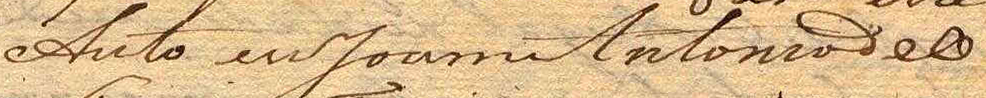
Auto eu Joam Antonio de O
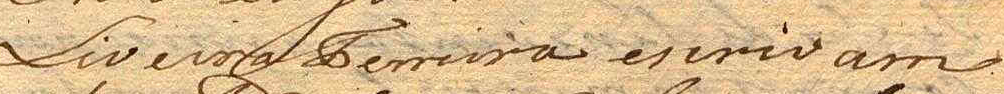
Liveira Ferreira escrivam
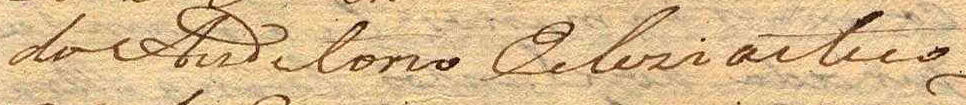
do Auditorio Ecleziastico
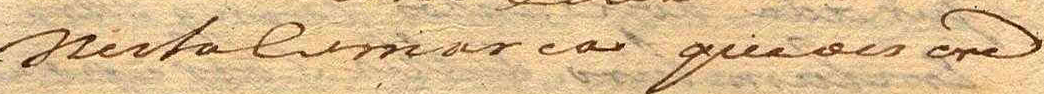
nesta Comarca que o escre
